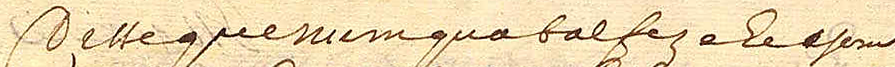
Disse que numqua tal fez e he e sem
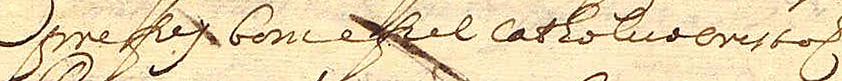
pre foj bom e fiel catholico cristaõ
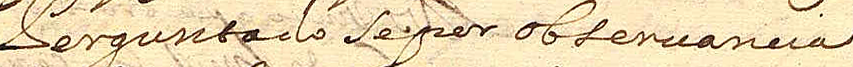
Perguntado se per obseruancia
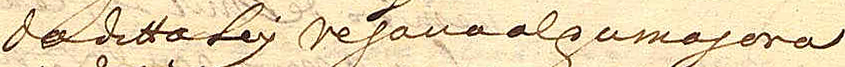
da ditta Ley resaua algumas ora
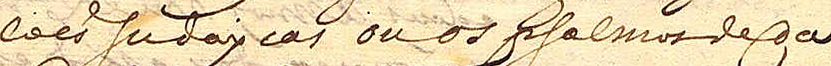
coẽs Judaycas ou os psalmos de Da
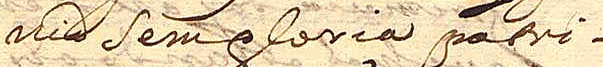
uid sem gloria patri
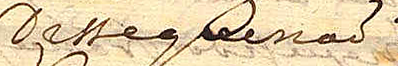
Disse que naõ
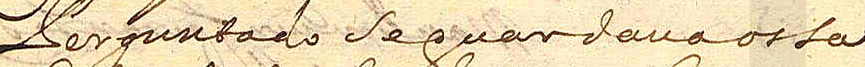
Perguntado se guardaua os sa
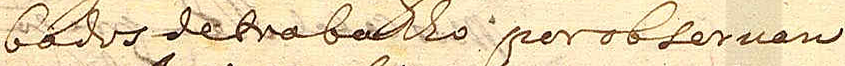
bados de trabalho per obseruan
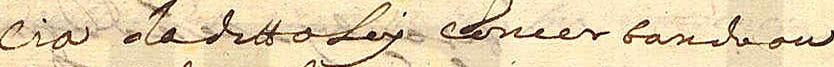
cia da ditta Ley concertando ou
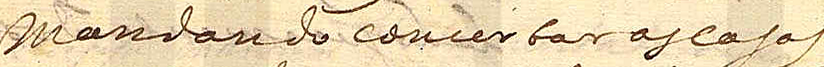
mandado concertar as casas
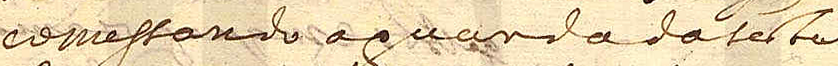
comessando a guarda da sesta
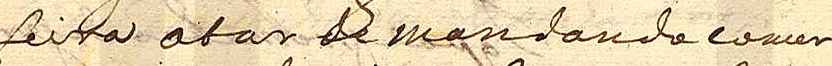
feira a tarde mandando concer
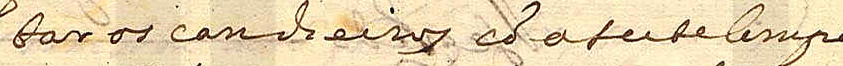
tar os candieiros cō aseite limpo
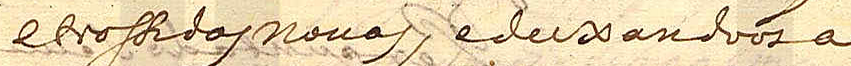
e trossidas nouas, e deixandoos a
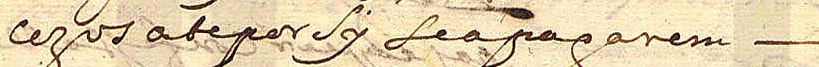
cezos ate pos sy se apagarem
